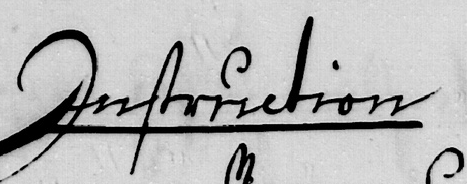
Instruction
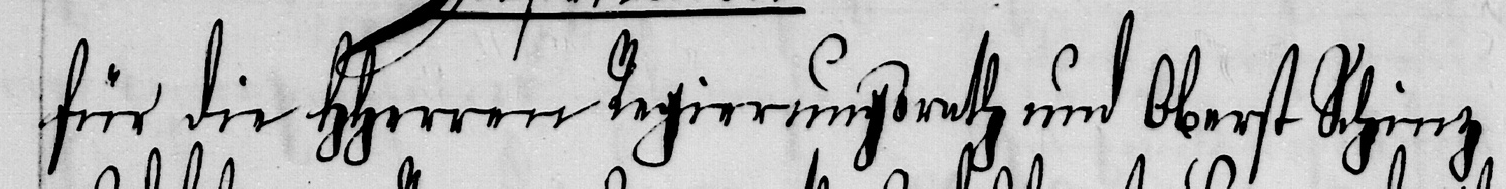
für die HHerren Regierungsrath und Oberst Schinz
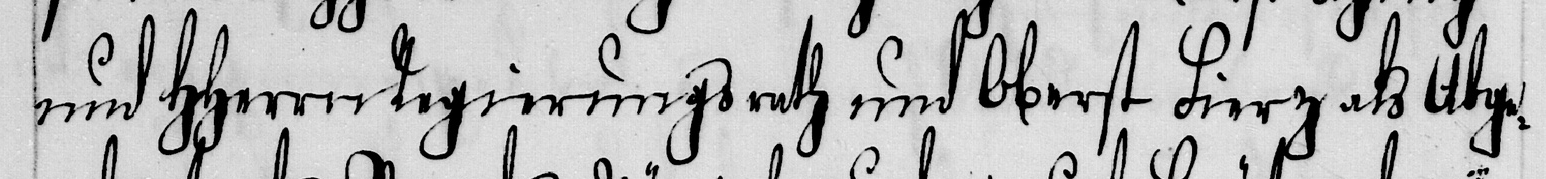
und HHerrn Regierungsrath und Oberst Fierz als Abg¬
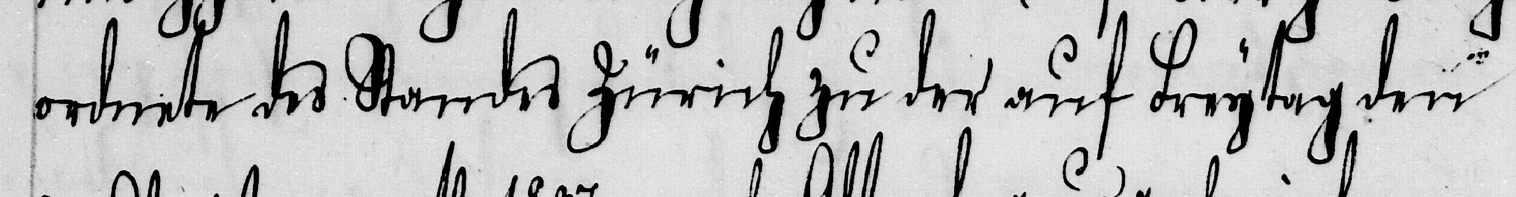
eordnete des Standes Zürich zu der auf Freytag den
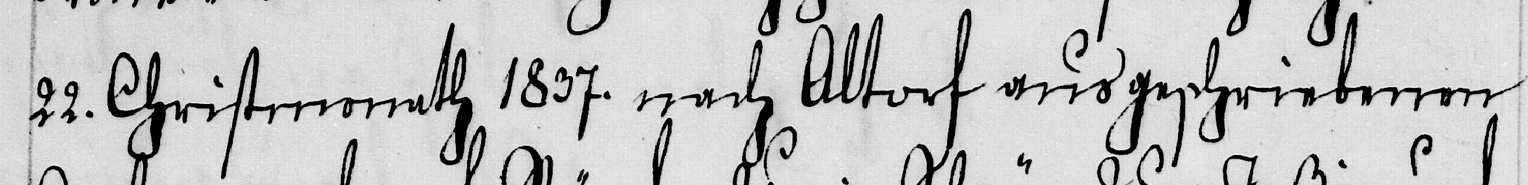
22. Christmonath 1837. nach Altorf ausgeschriebenen
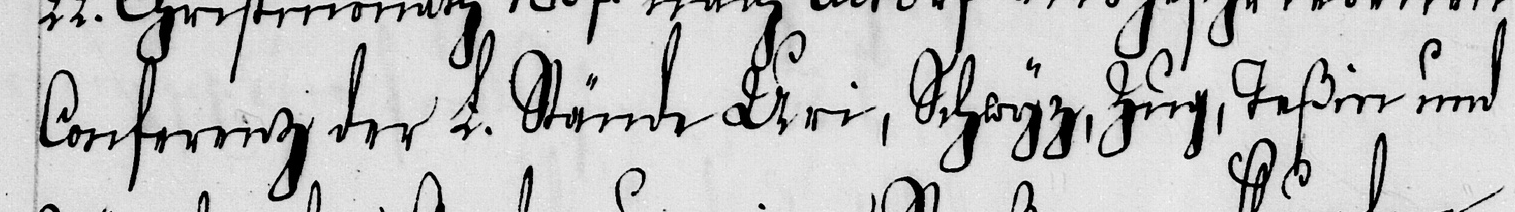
Conferenz der L. Stände Uri, Schwyz, Zug, Teßin und
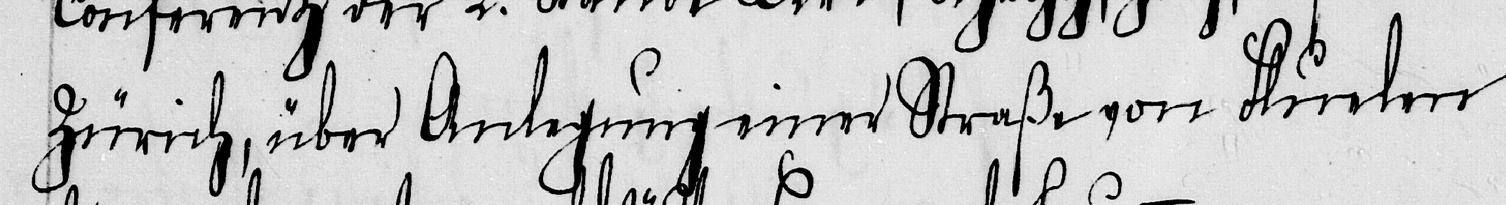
Zürich, über Anlegung einer Straße von Fluelen
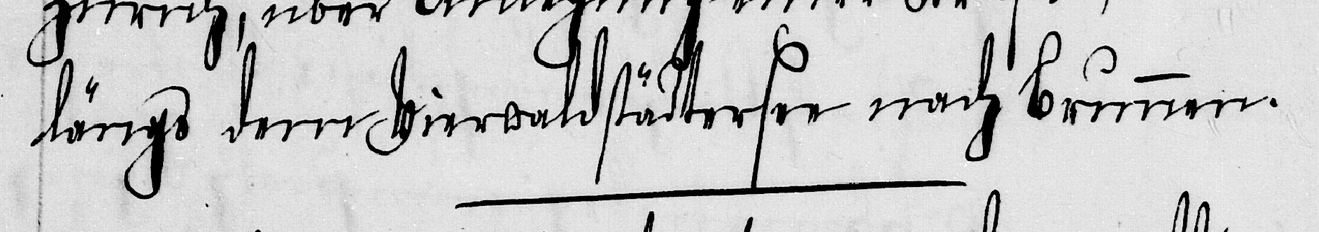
längs dem Vierwaldstättersee nach Brunnen.
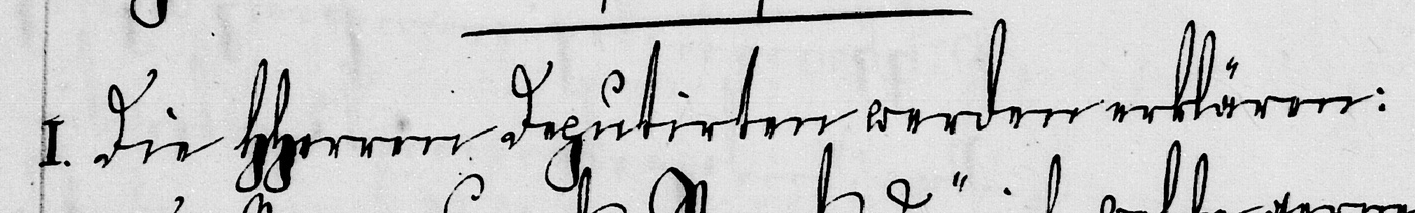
I. Die HHerrn Deputirten werden erklären:
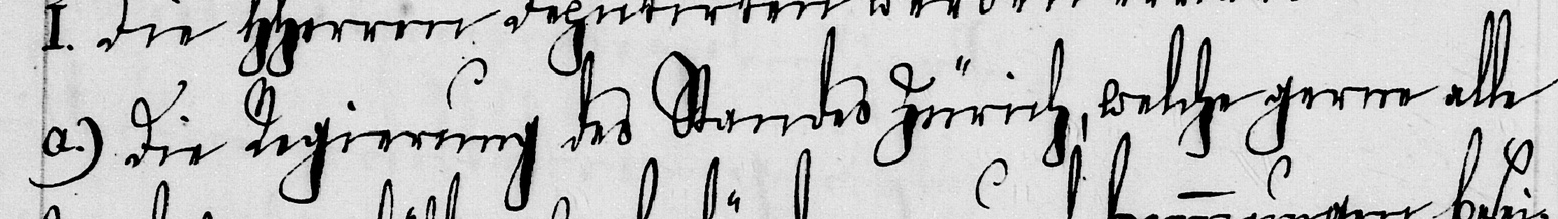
a.) Die Regierung des Standes Zürich, welche gerne alle
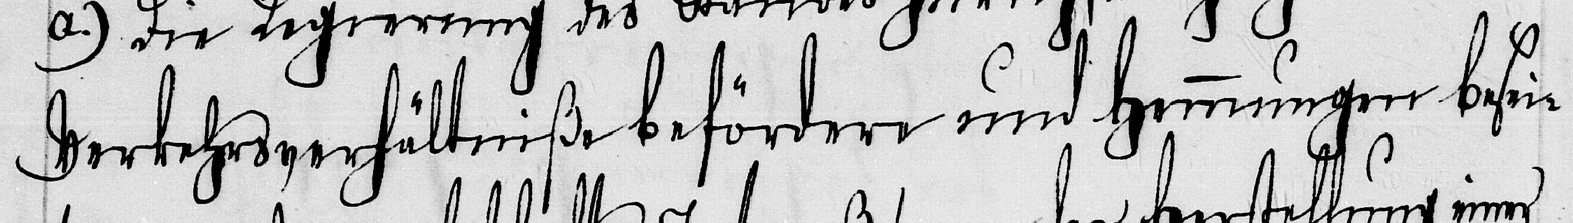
Verkehrsverhältniße befördere und Hemmungen bese¬
